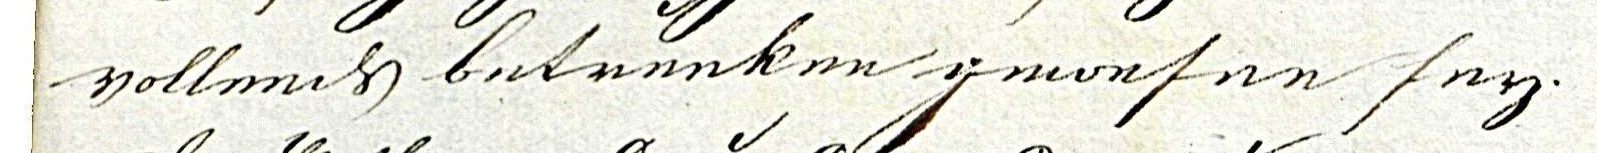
vollends betrunken gewesen sey.
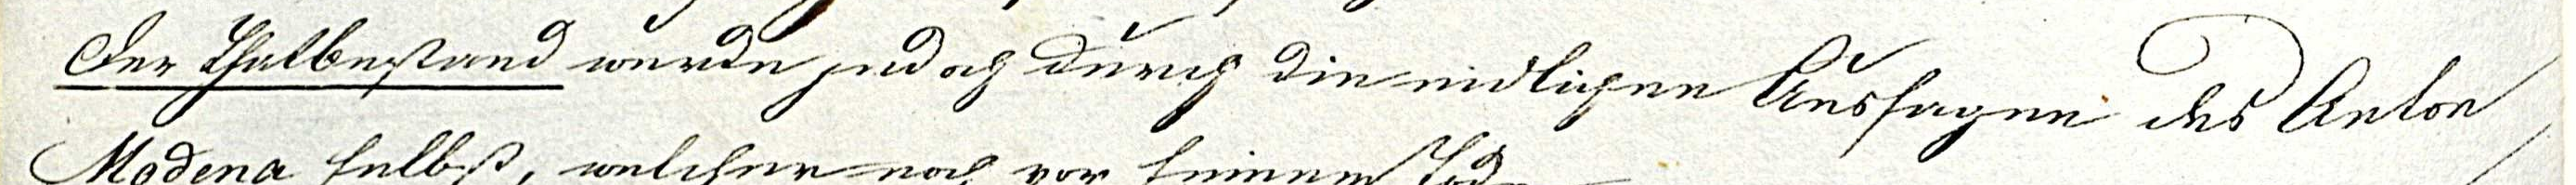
Der Thatbestand wurde jedoch durch die eidlichen Aussagen des Anton
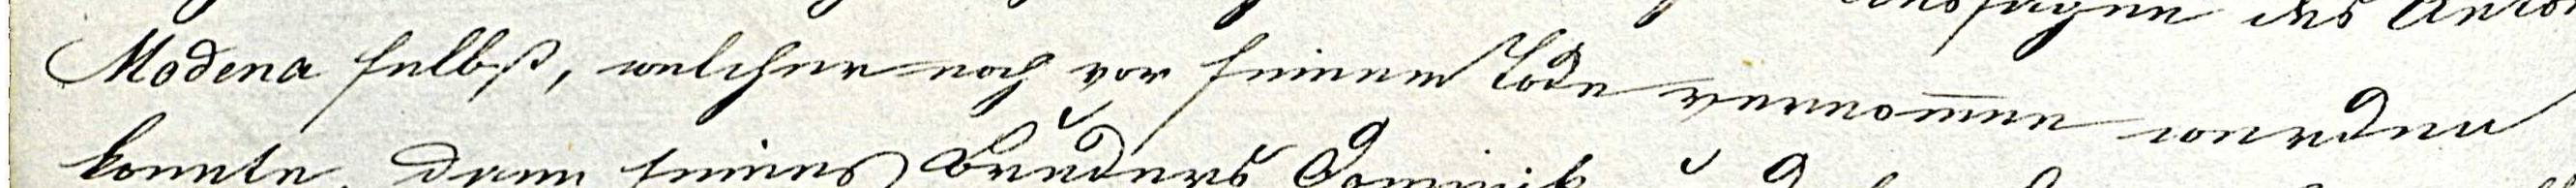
Modena selbst, welcher noch vor seinem Tode vernommen werden
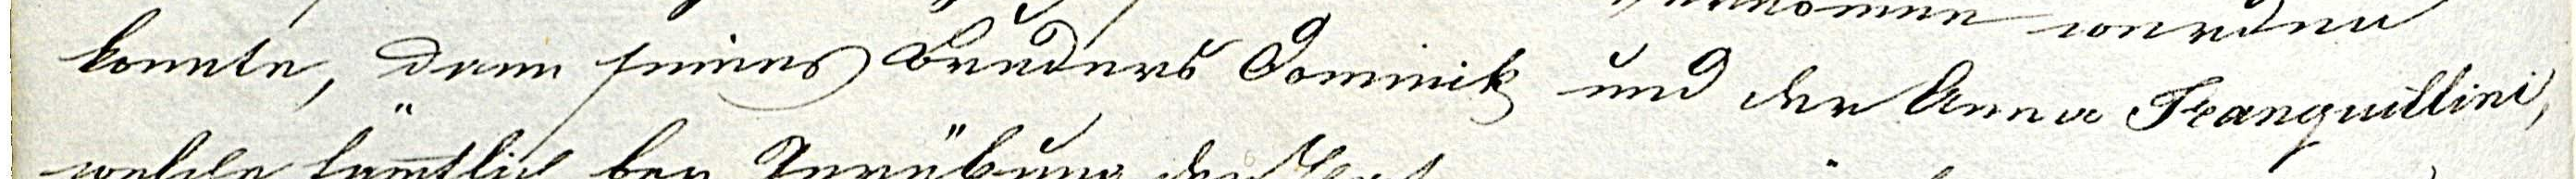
konnte, dan seines Bruders Dominik und der Anna Tranquillini,
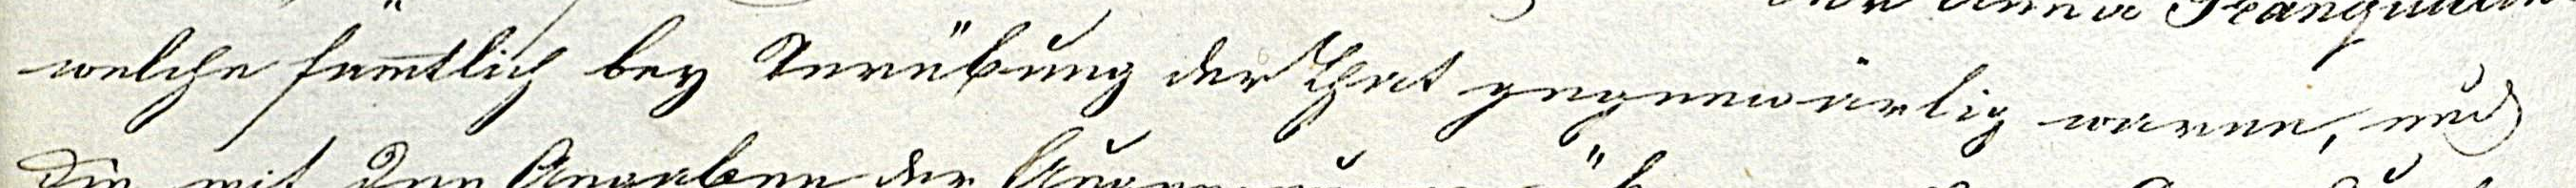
welche sämtlich bey Verübung der That gegenwärtig waren, auch
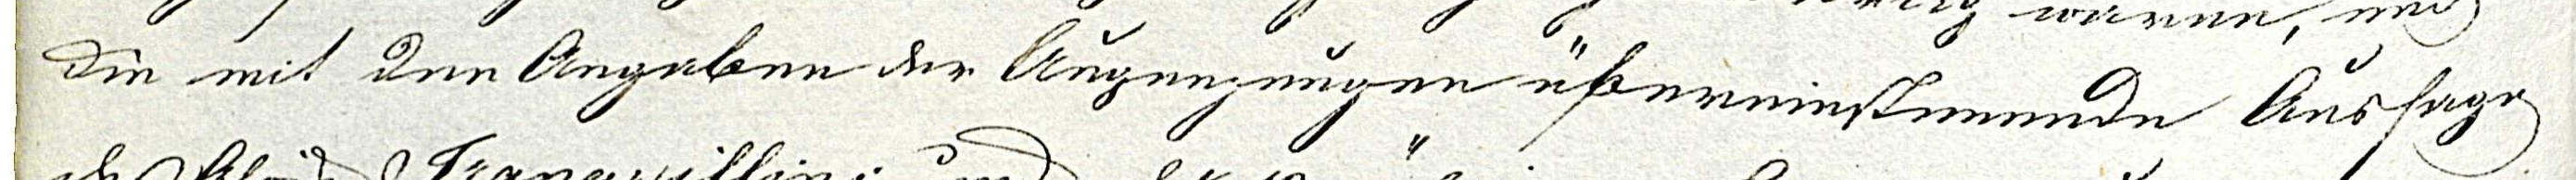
die mit den Angaben der Augenzeugen übereinstxx Aussage
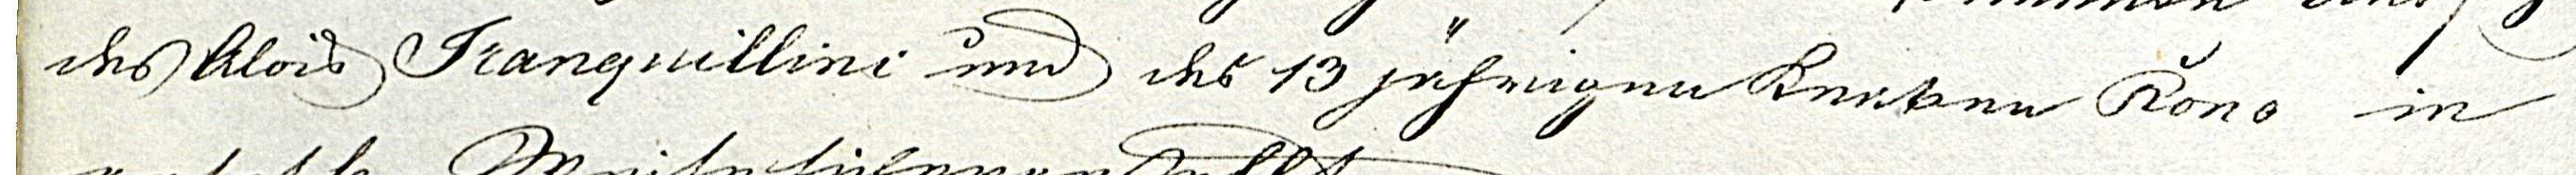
des Alois Tranquillini und des 13 jährigen Knaben Kono in
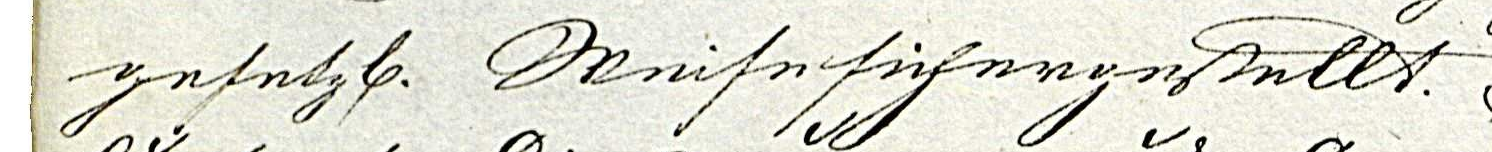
gesetzt xx Weisesichergestellt.
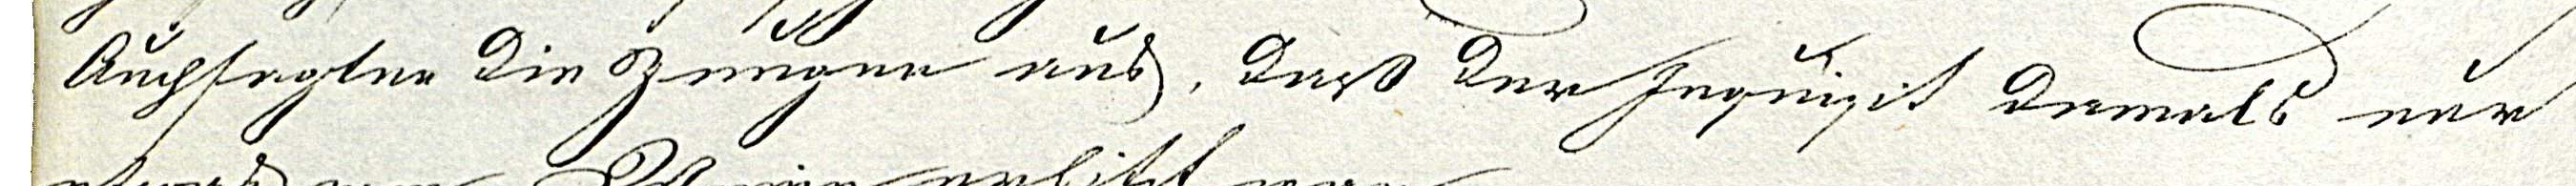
Auchsagten die Zeugen aus, daß der Jnquisit damals nur
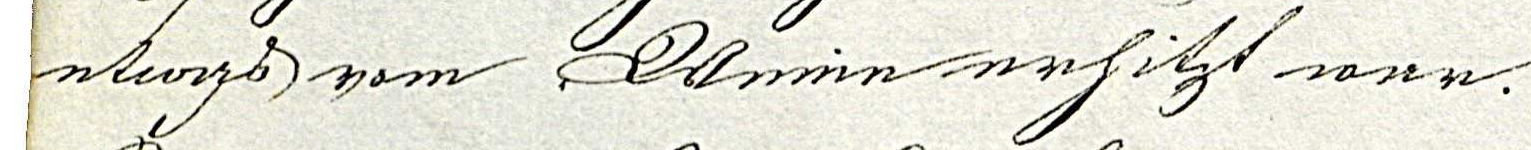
etwas vom Weine erhitzt war.
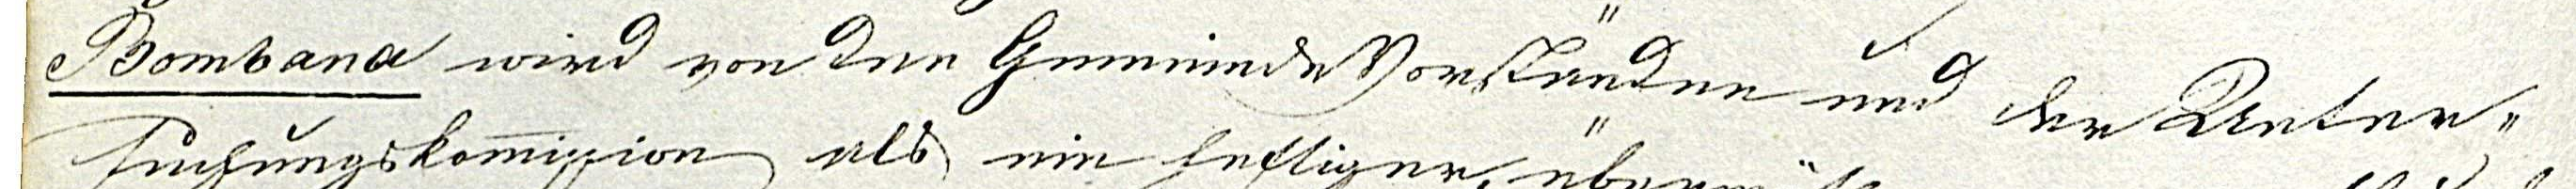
Bombana wird von den Gemeinde Vorständen und der Unter¬
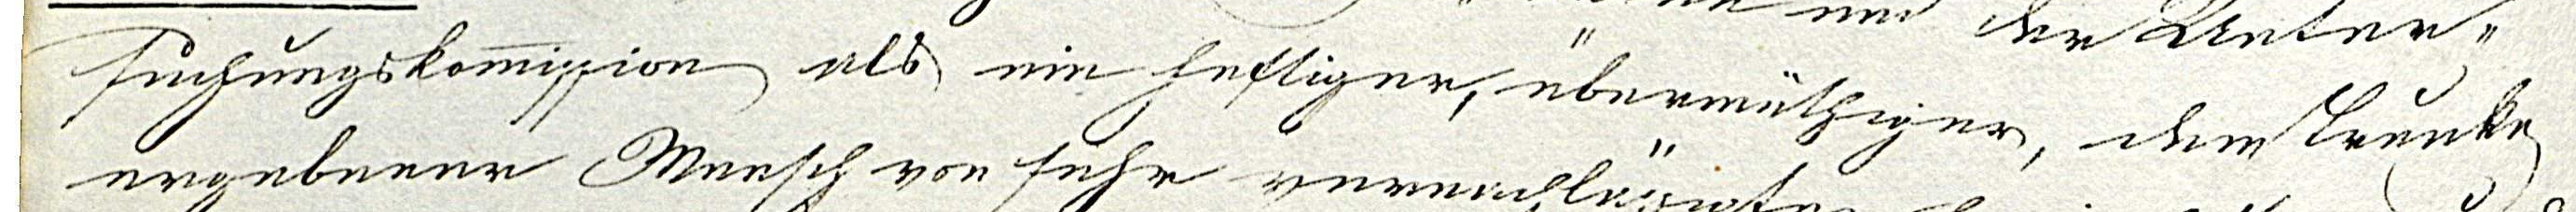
suchungskommission als nie heftiger, übermüthiger, dem Trunke
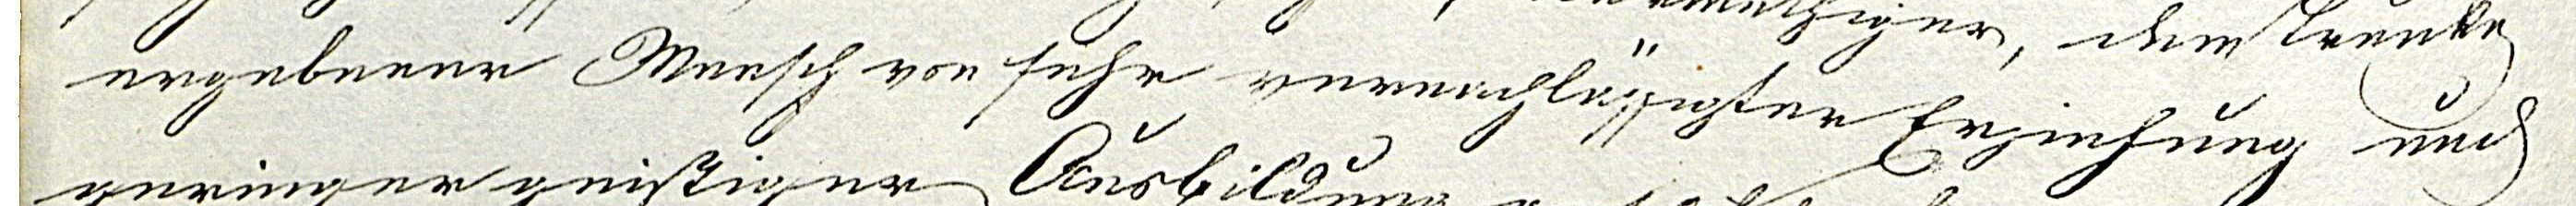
ergebener Mensch von sehr vernachlässigter Erziehung auch
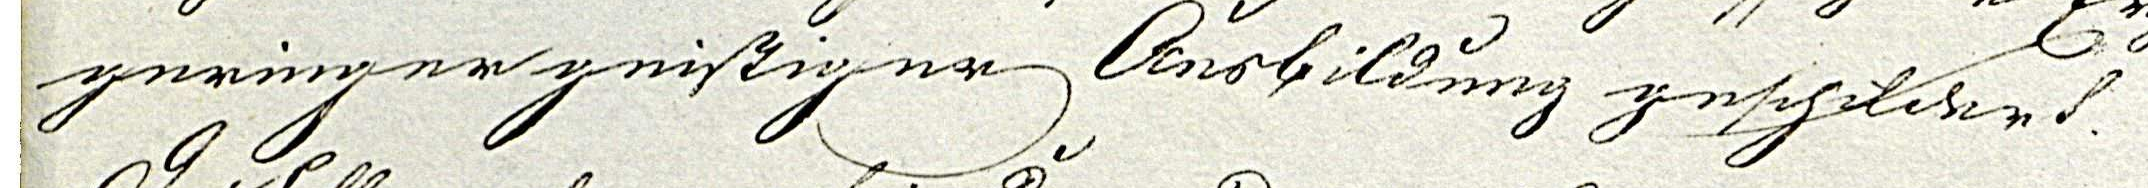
geringer geistiger Ausbildung geschildert.
